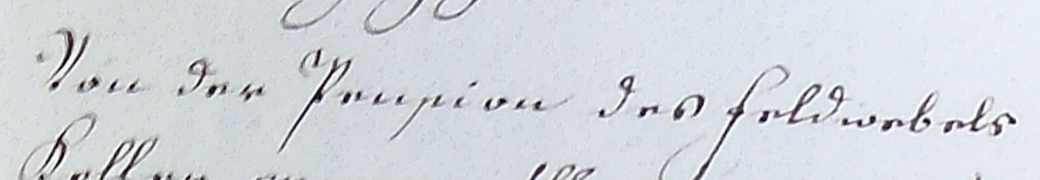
Von der Pension des Feldwebels
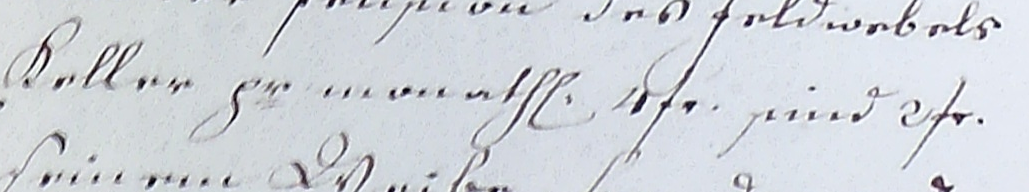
Keller pr monathl: 4fr. sind 2fr.
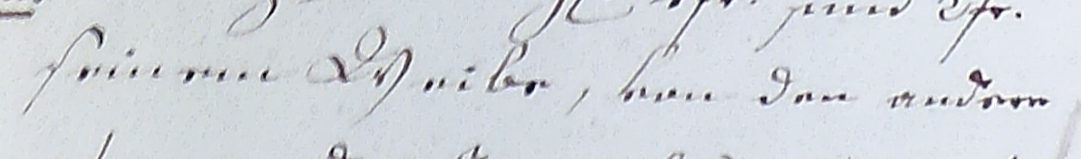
seinem Weibe, von den andern
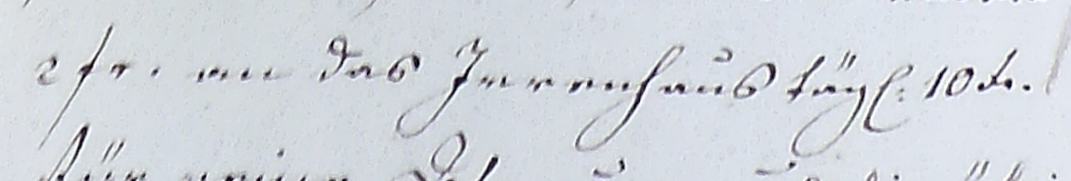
2fr. an das Irrenhaus tägl: 10kr.
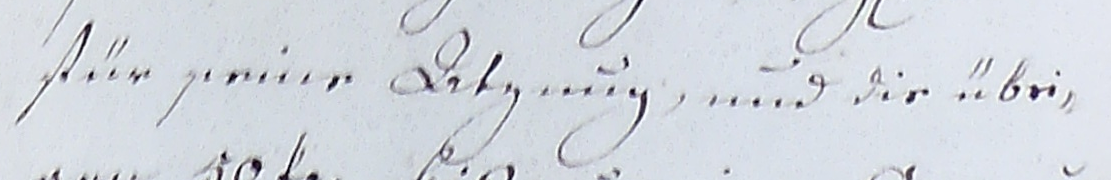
für seine Atzug, und die übri¬
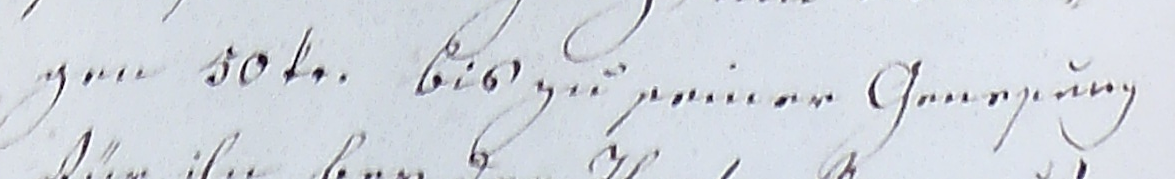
gen 50kr. bis zu sein̅er Genesung
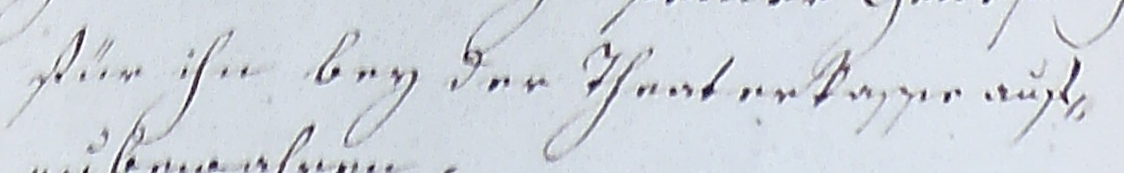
für ihn bey der Theaterkasse auf¬
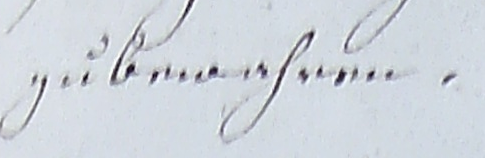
zubewahren.
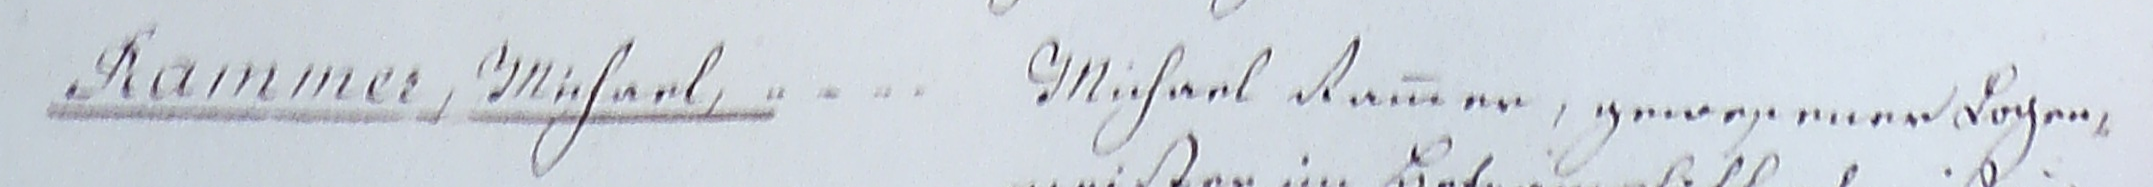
Rammer, Michael, .. .. .. Michael Ram̅er, gewesener Logen¬
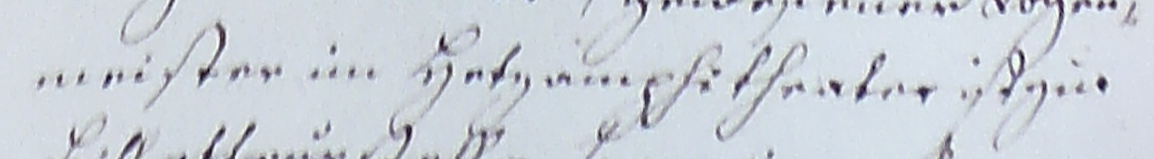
meister im Hetzamphitheater ist zur
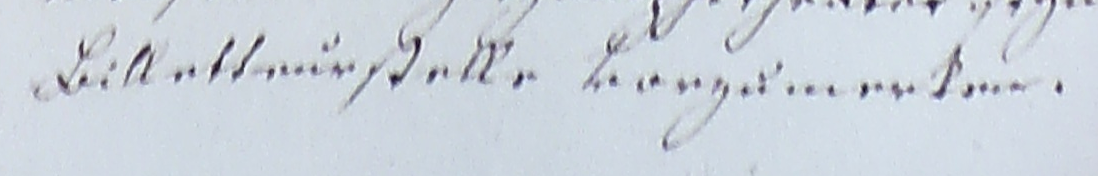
Billetteurstelle vorzumerken.
